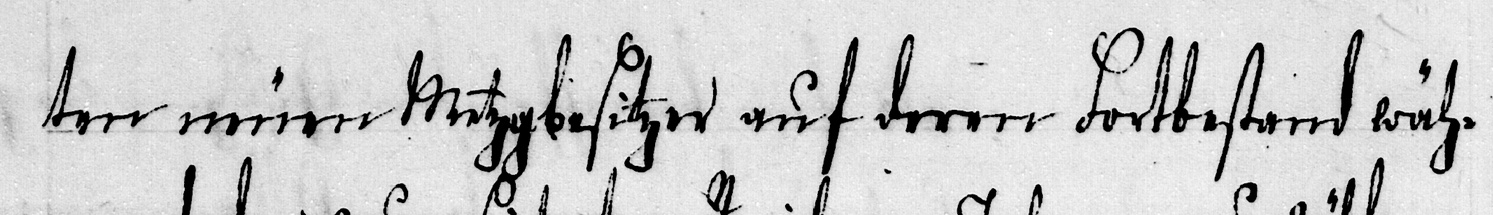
ten neuen Metzgbesitzer auf deren Fortbestand wäh¬
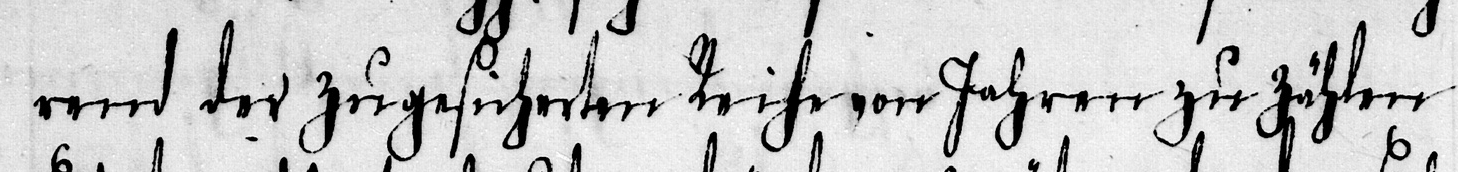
rend der zugesicherten Reihe von Jahren zu zählen
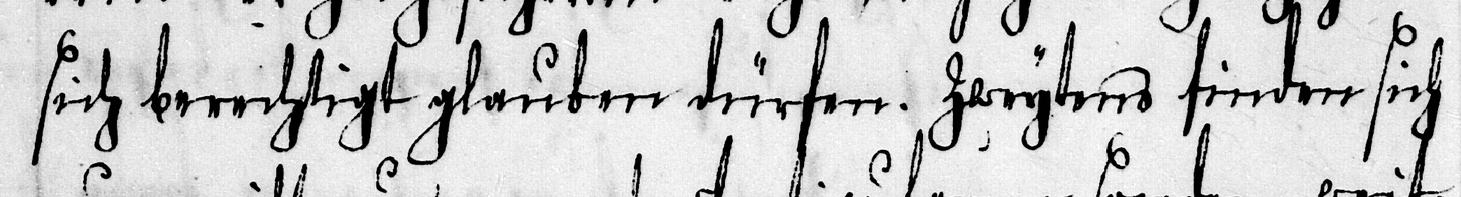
sich berechtigt glauben dürfen. Zweytens finden sich
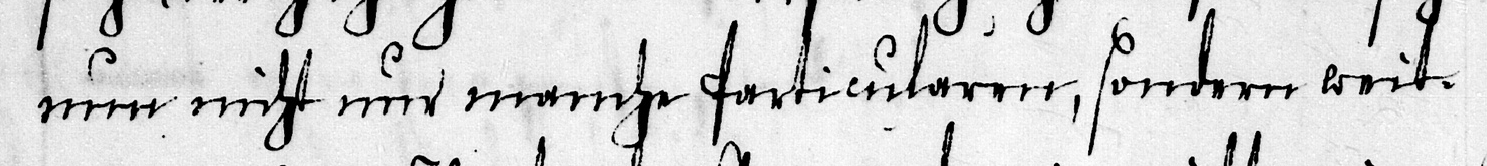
nun nicht nur manche Particularen, sondern weit¬
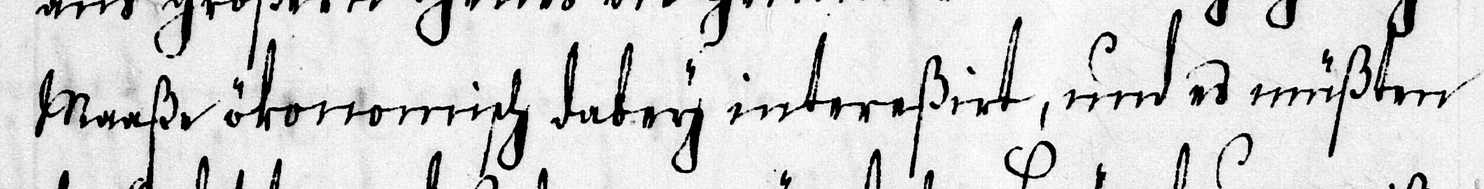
Maaße ökonomisch dabey intereßirt, und es müßten
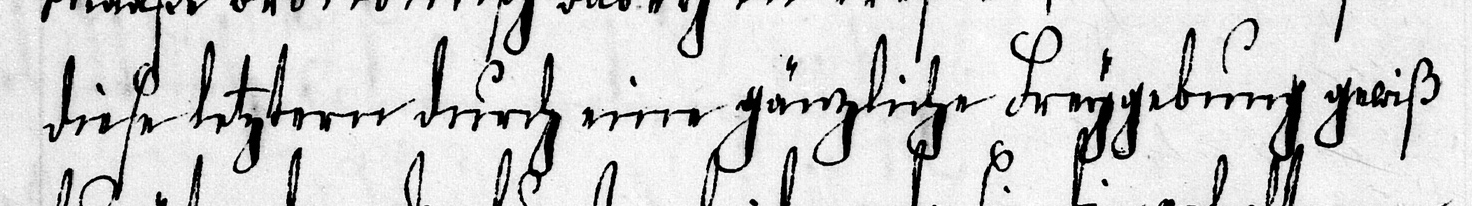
diese letztern durch eine gänzliche Freygebung gewiß
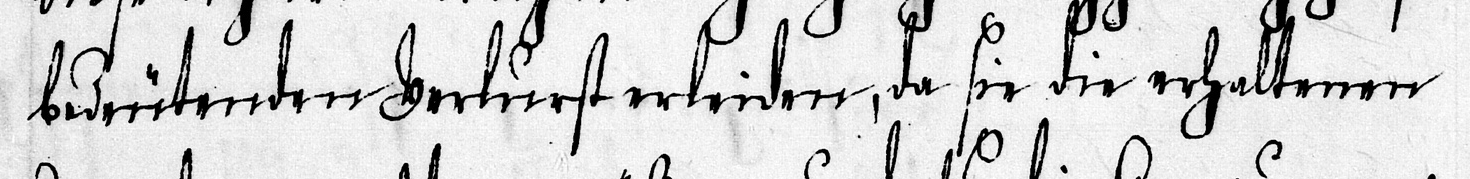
bedeutenden Verlust erleiden, da sie die erhaltenen
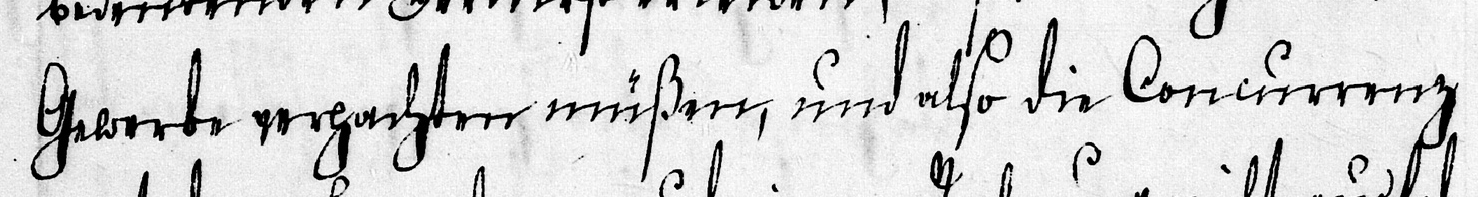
Gewerbe verpachten müßen, und also die Concurrenz
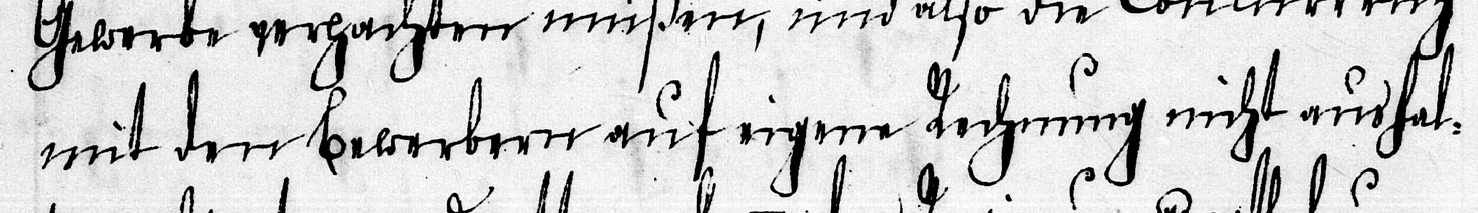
mit den Bewerbern auf eigene Rechnung nicht aushal¬
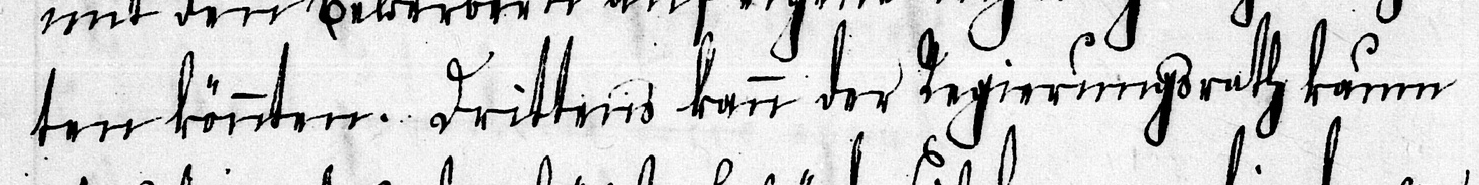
ten könnten. Drittens kann der Regierungsrath kaum
